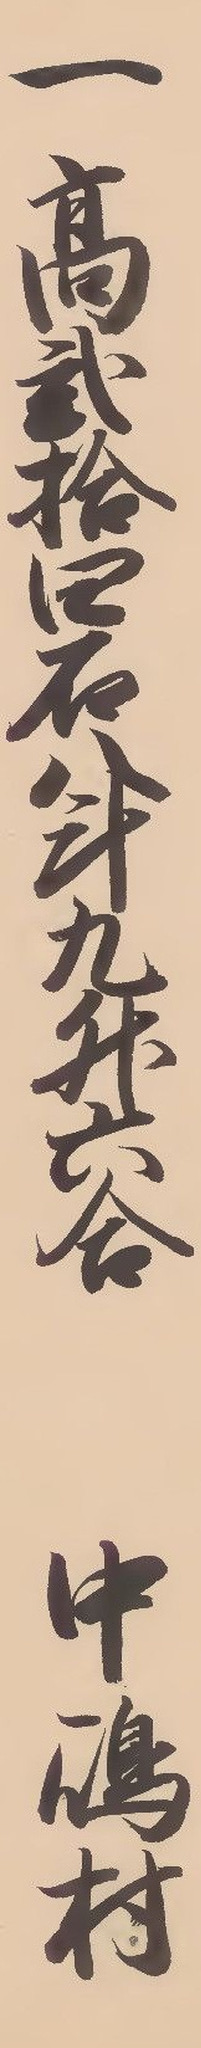一高弐拾四石八斗九升六合中島村

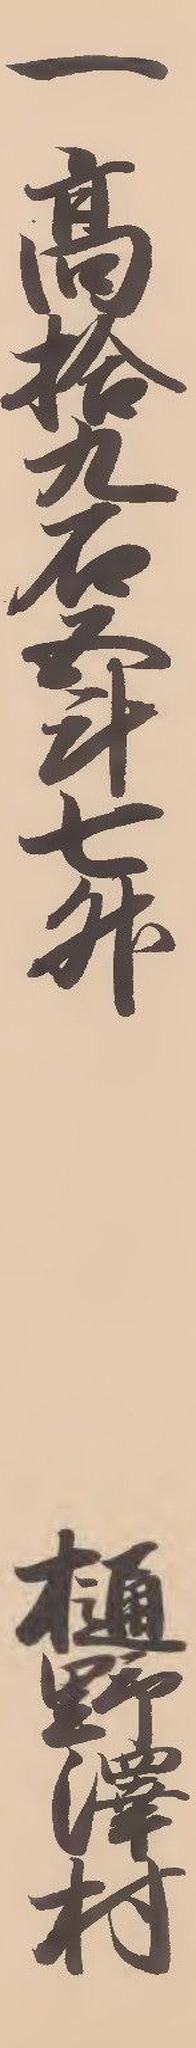一高拾九石五斗七升樋野沢村
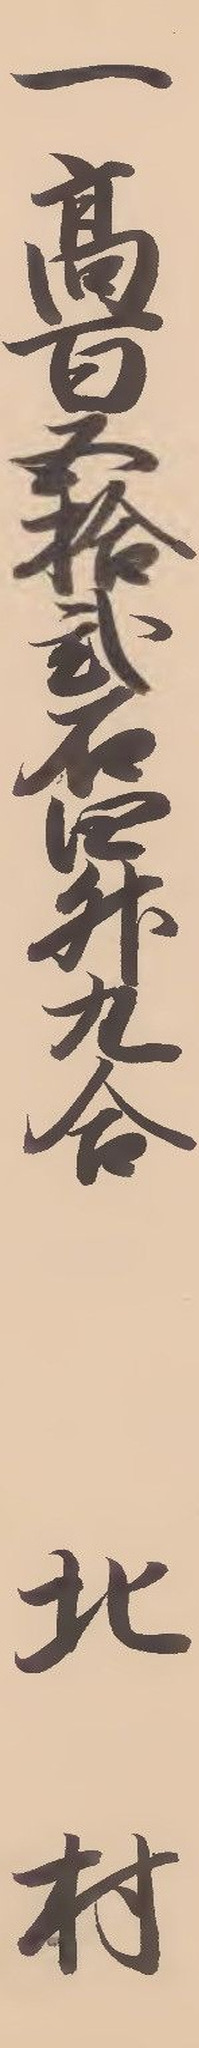一高百五拾弐石四升九合北村
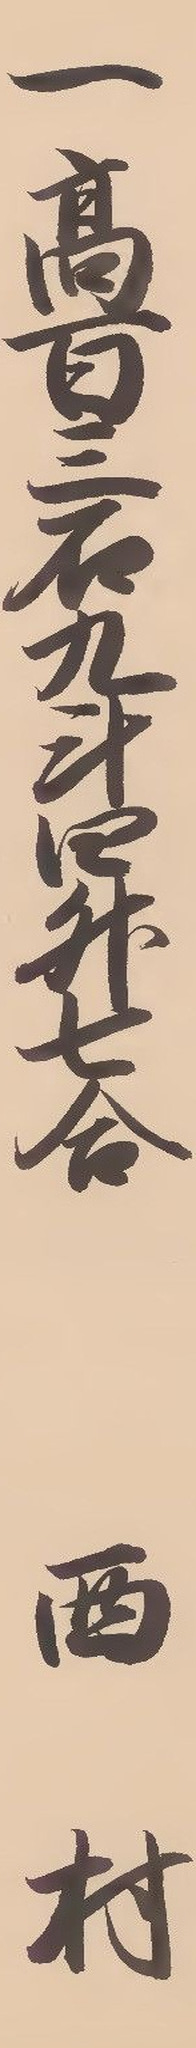一高百三石九斗四升七合西村
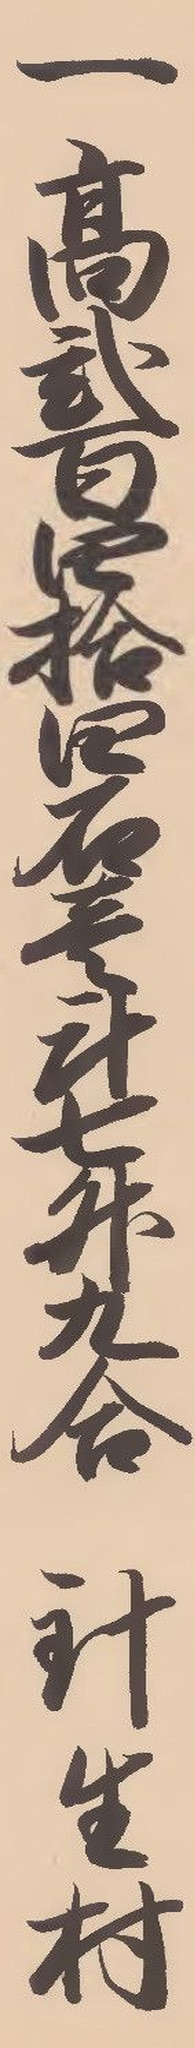一高弐百四拾四石壱斗七升九合針生村
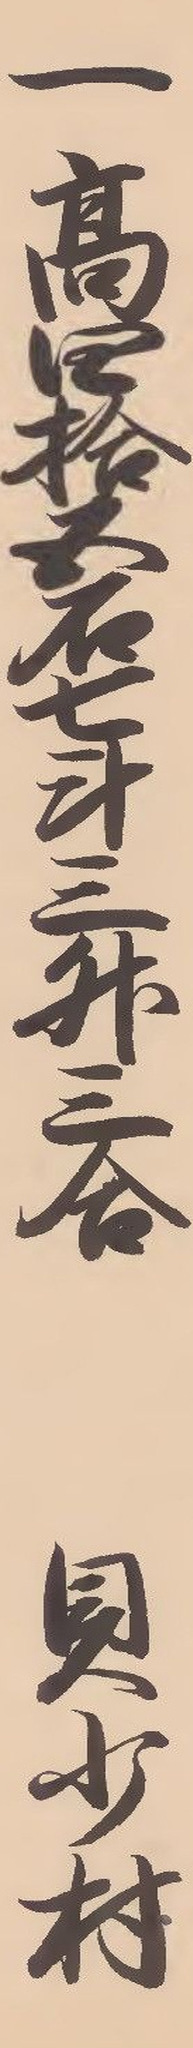一高四拾五石七斗三升三合貝少村
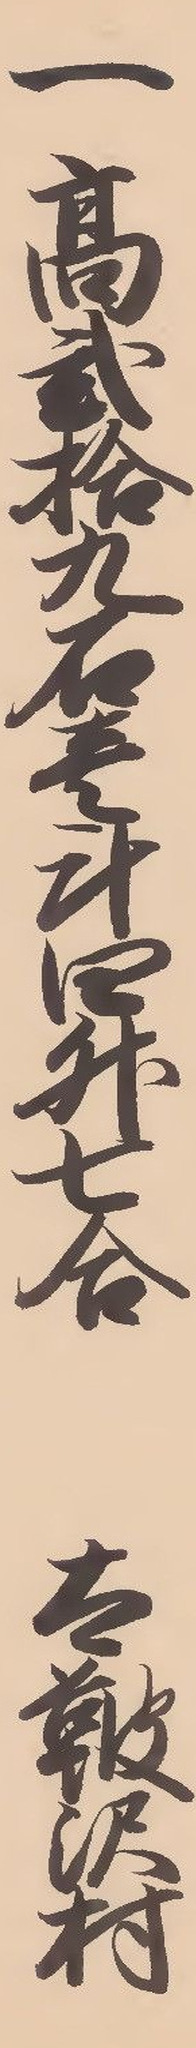一高弐拾九石壱斗四升七合太鼓沢村
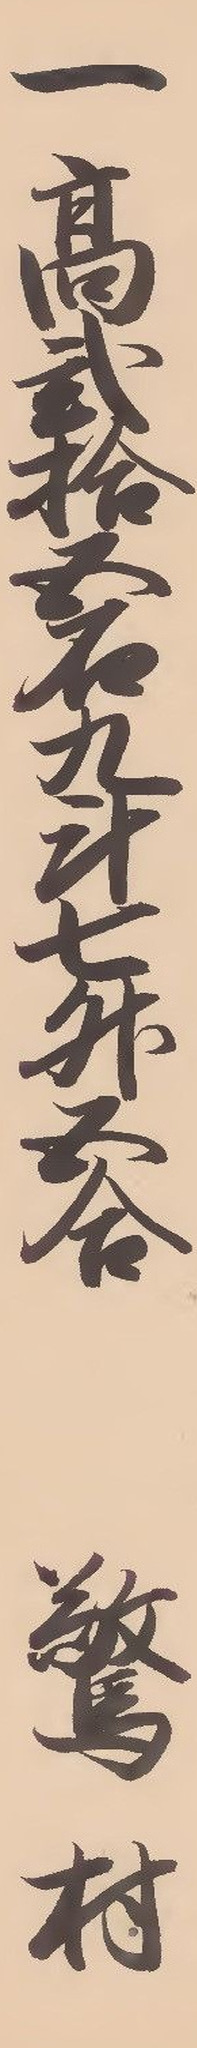一高弐拾五石九斗七升五合驚村

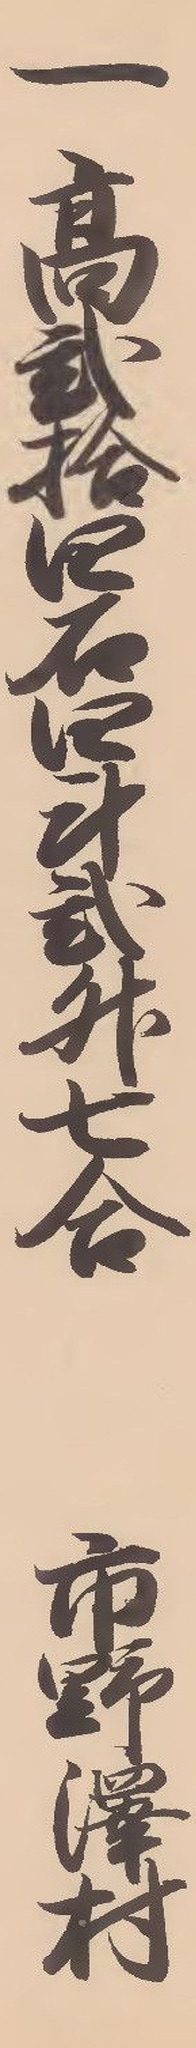一高弐拾四石四斗弐升七合市野沢村
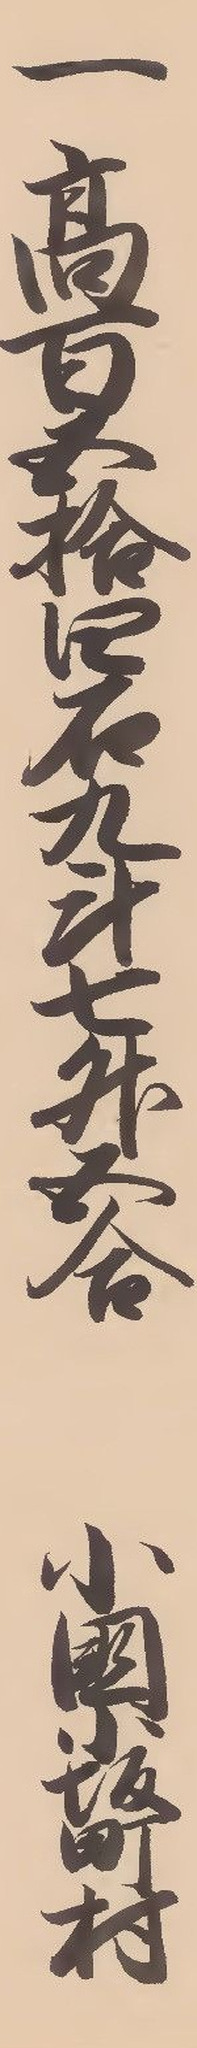一高百五拾四石九斗七升五合小国小坂町村
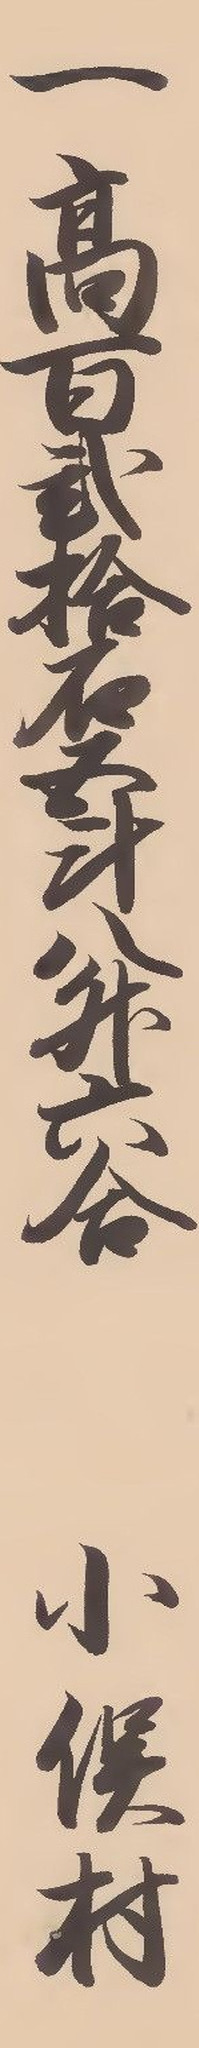一高百弐拾石五斗八升六合小俣村
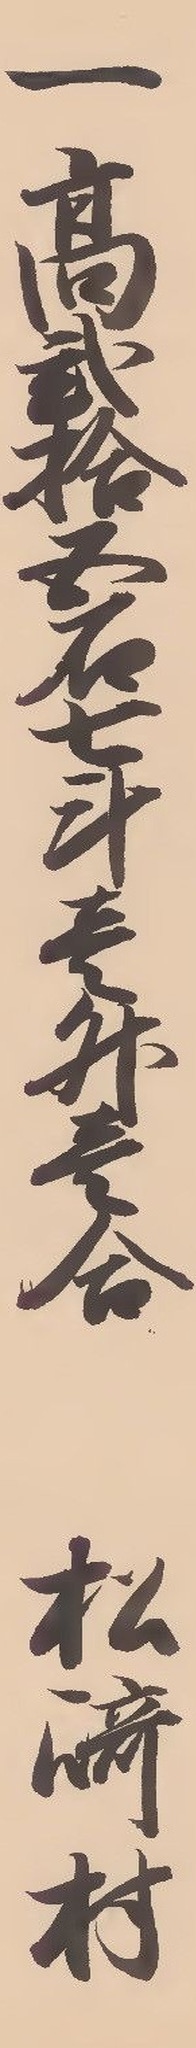一高弐拾五石七斗壱升壱合松崎村
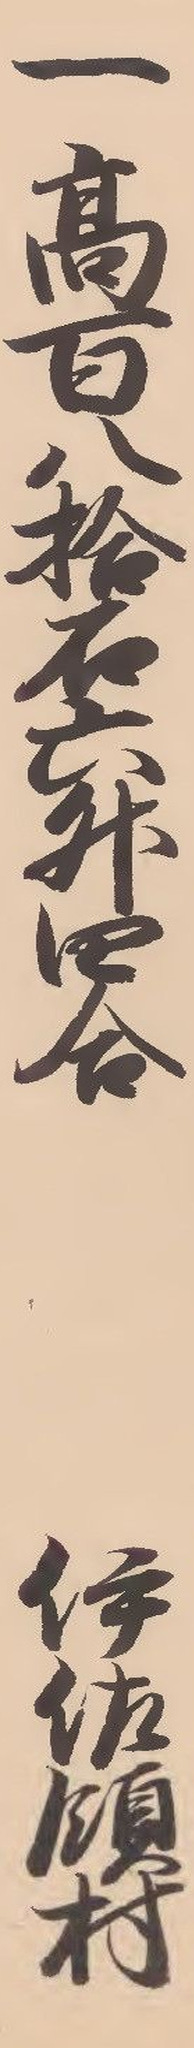一高百八拾石六升四合伊佐領村
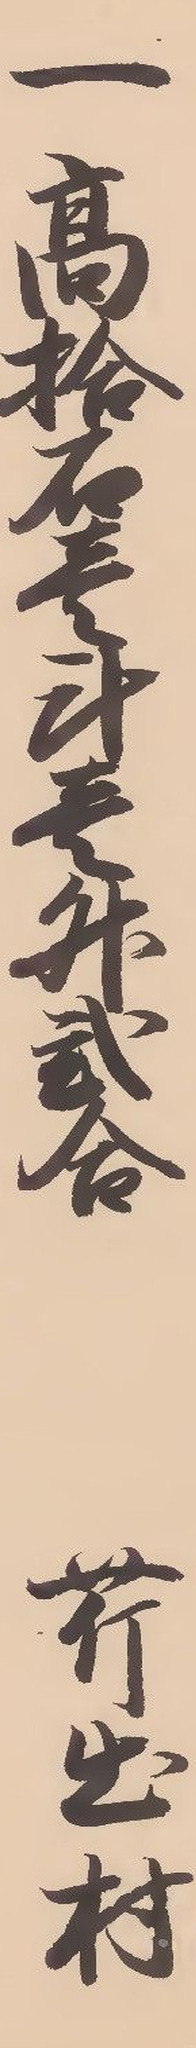一高拾石壱斗壱升弐合芹出村
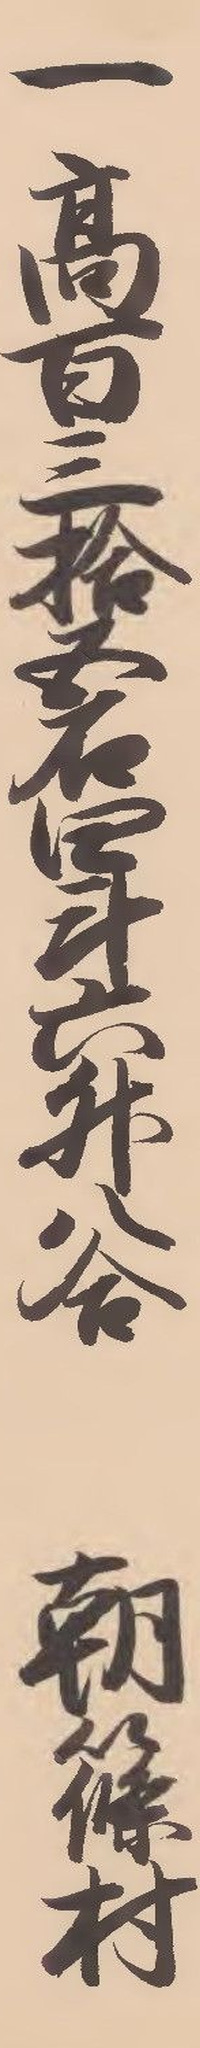一高百三拾五石四斗六升八合朝篠村
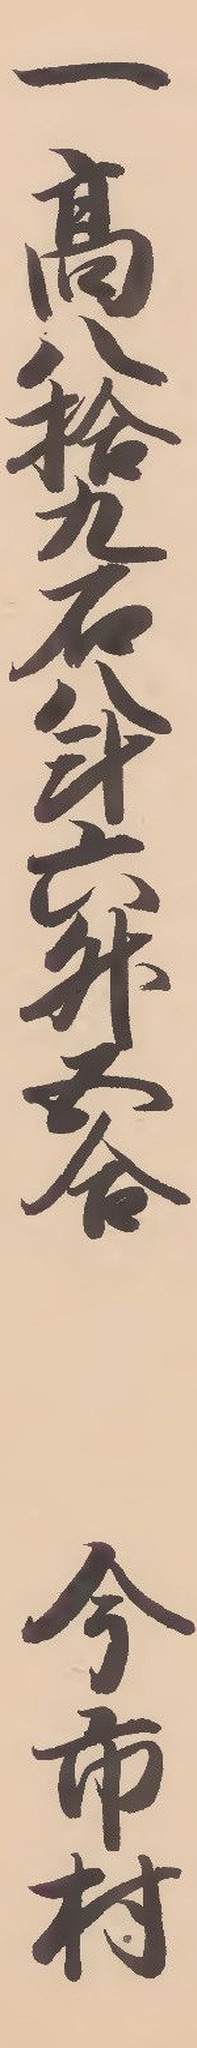一高八拾九石八斗六升五合今市村
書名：出羽国郷帳　１
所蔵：国立公文書館 National Archives of Japan
